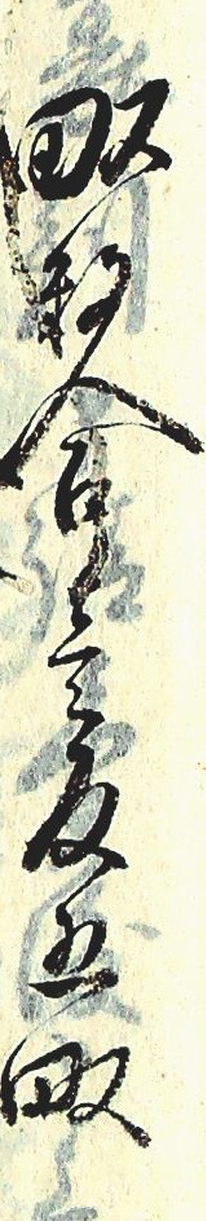畝数合壱反五畝
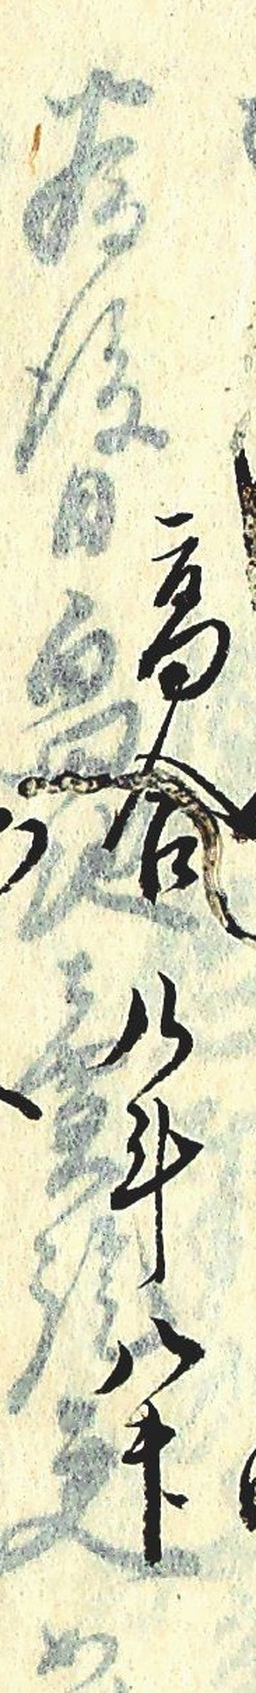高合八斗八升
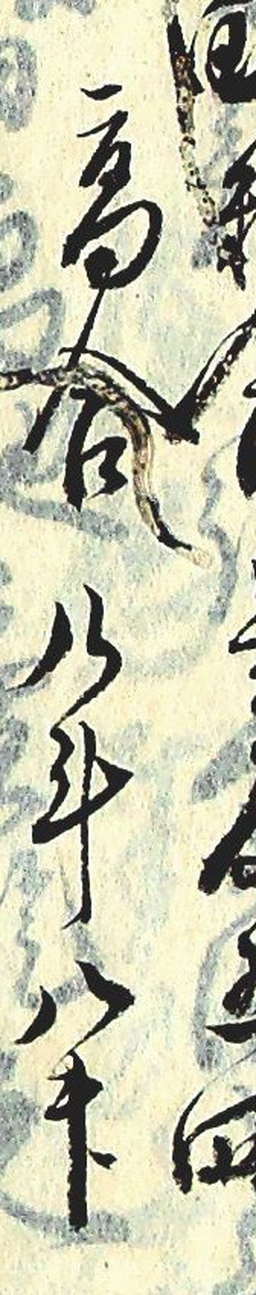高合八斗八升
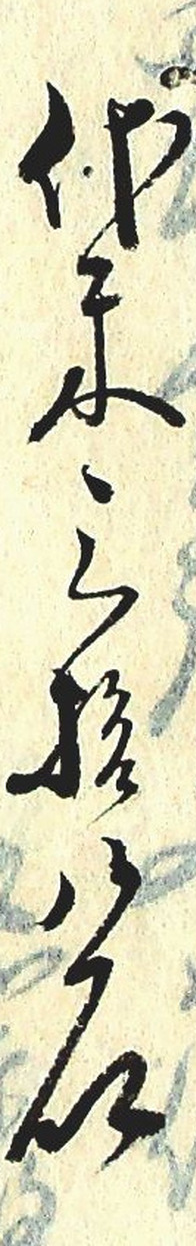代米三拾八石
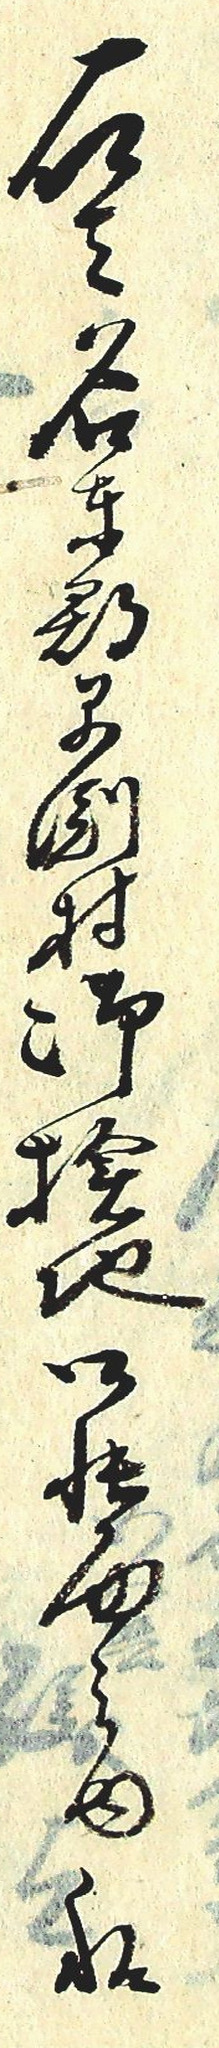右は名東郡早淵村御検地御帳面之内私
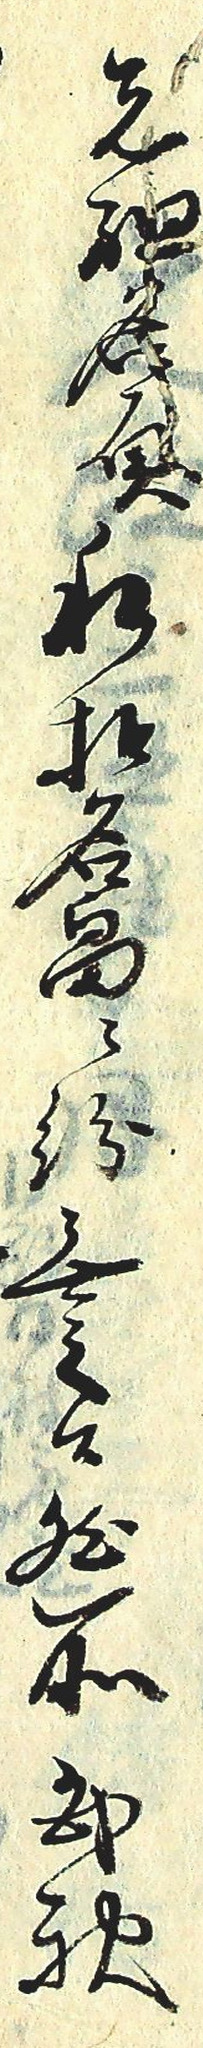先祖名負私扣名畠に紛無之候然所当秋
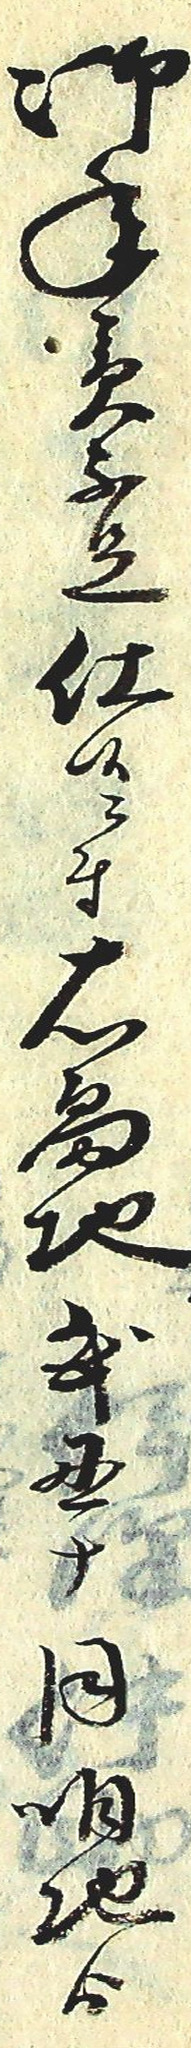御年貢不足仕候に付右畠地当丑十月明地ゟ
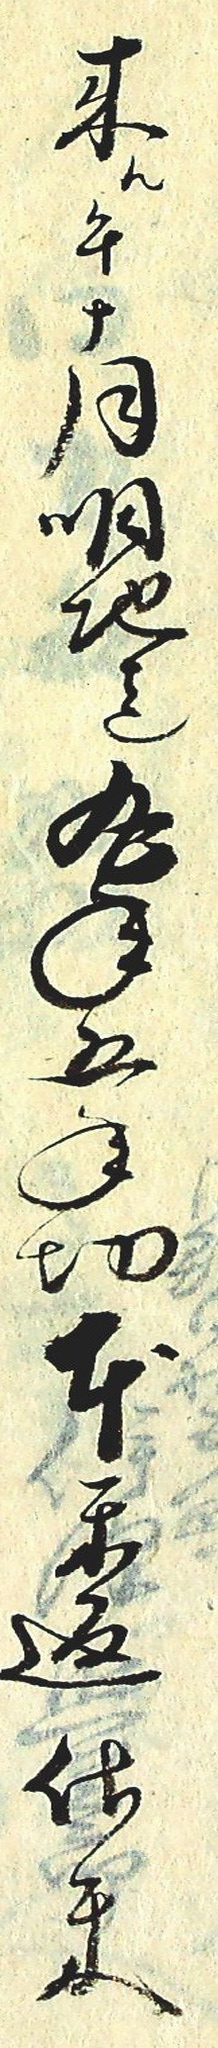来る午十月明地迄丸年五年切本米返仕米
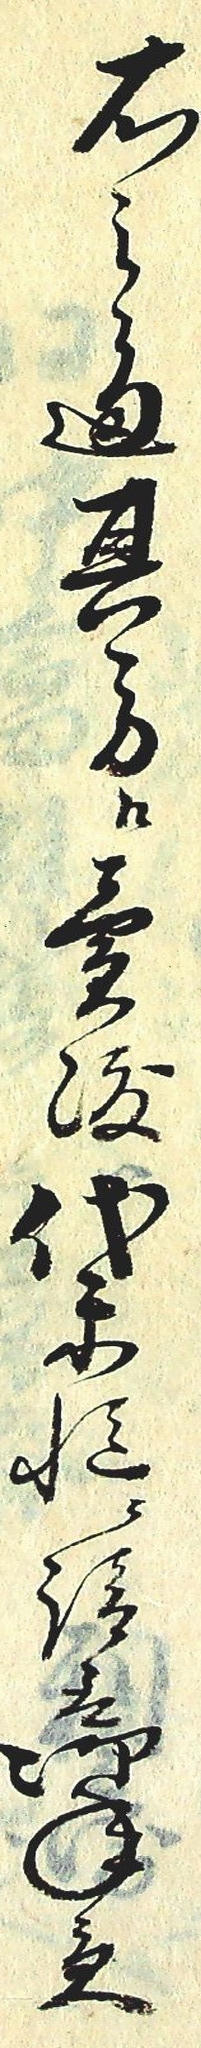右之通其方え売渡代米慥に請取御年貢
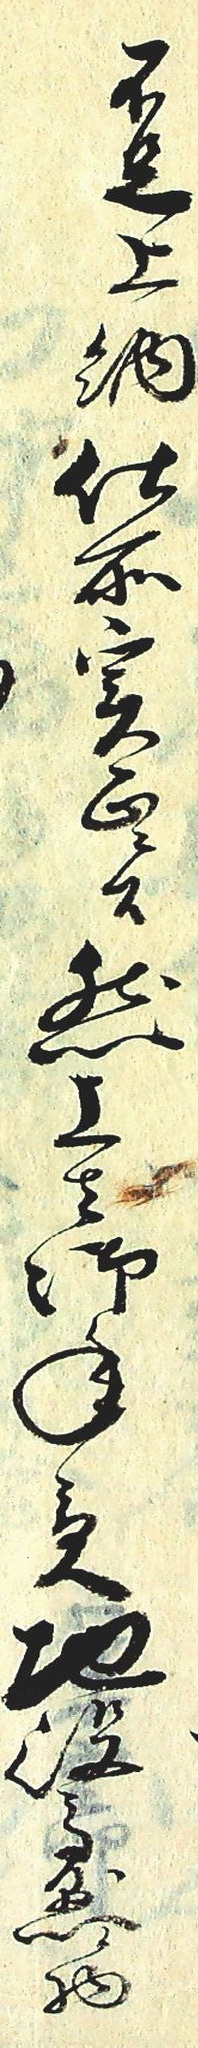不足上納仕所実正に候然上は御年貢地役高懸り物
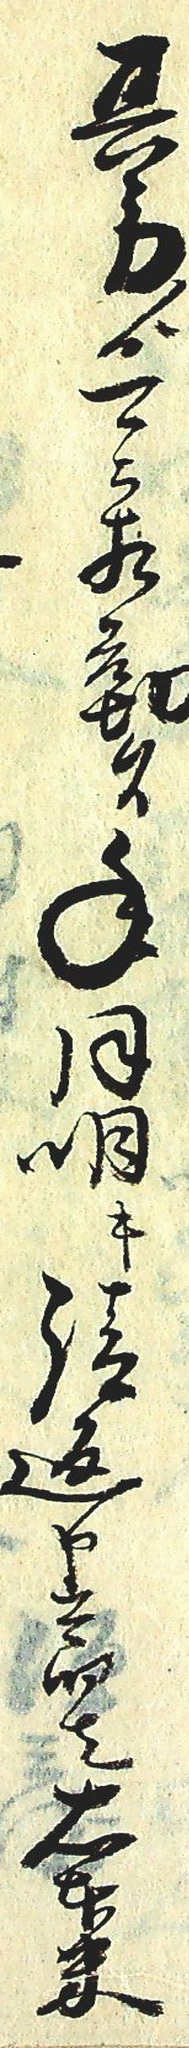其方ゟ可被相勤候年月明き請返申節は右本米
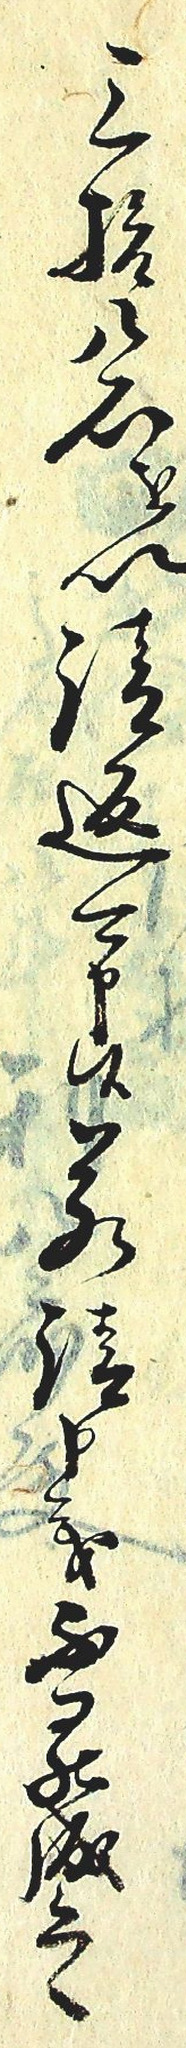三拾八石を以請返可申候若請申義不罷成候はゝ
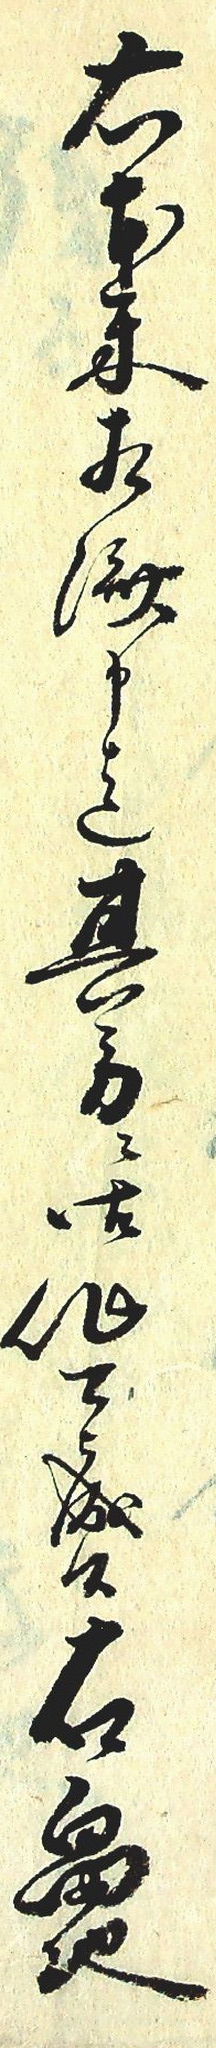右本米相済申迄其方に御作可被成候右畠地
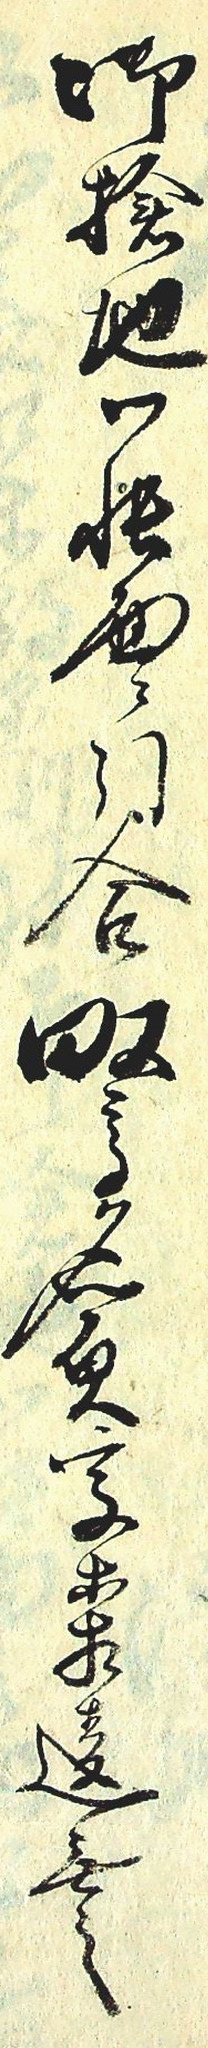御検地御帳面に引合畝高名負字等相違無之
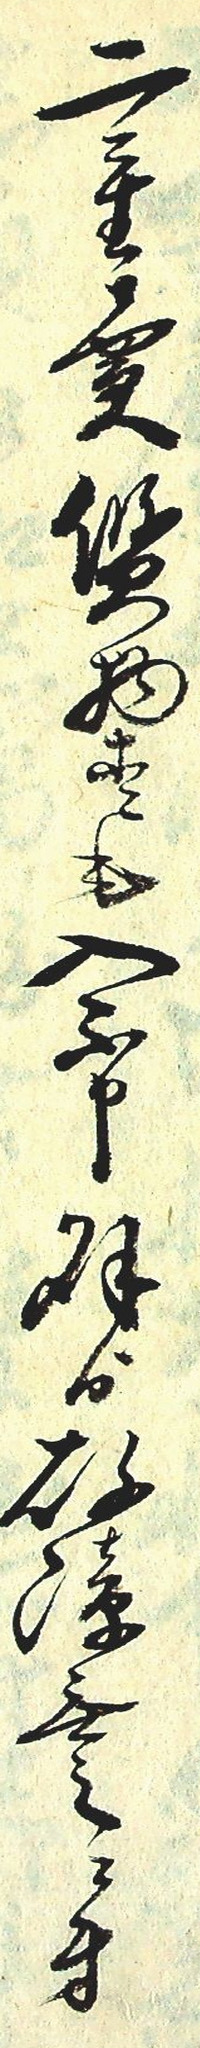二重売質物等にも入不申外ゟ故障無之に付
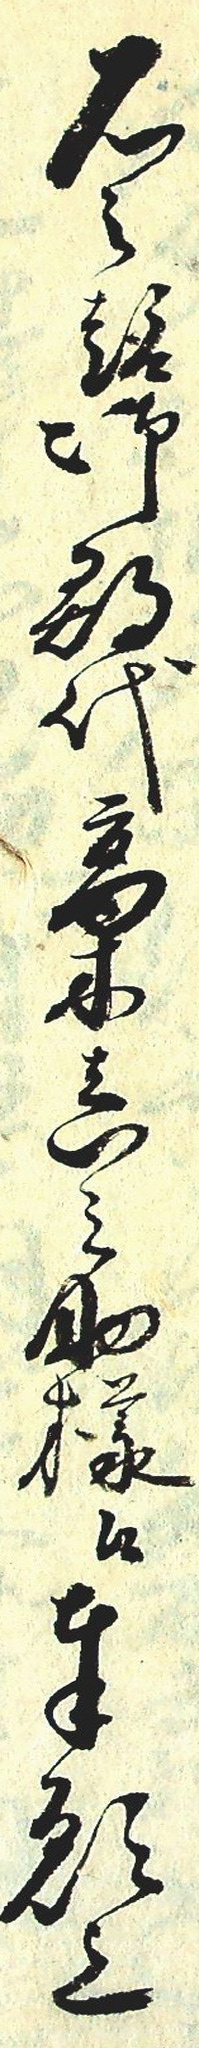右之趣御郡代高木真之助様え奉願上
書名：諸御願書控(弐番）
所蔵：鳴門教育大学 Naruto University of Education
